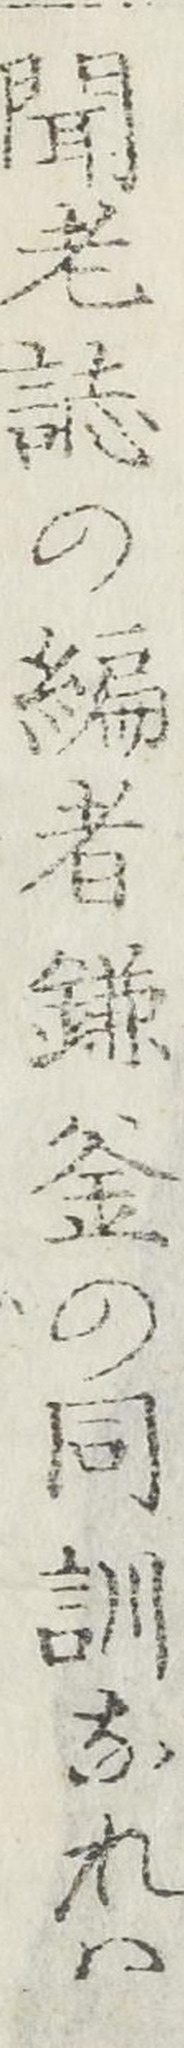聞老誌の編者鎌釜の同訓なれは
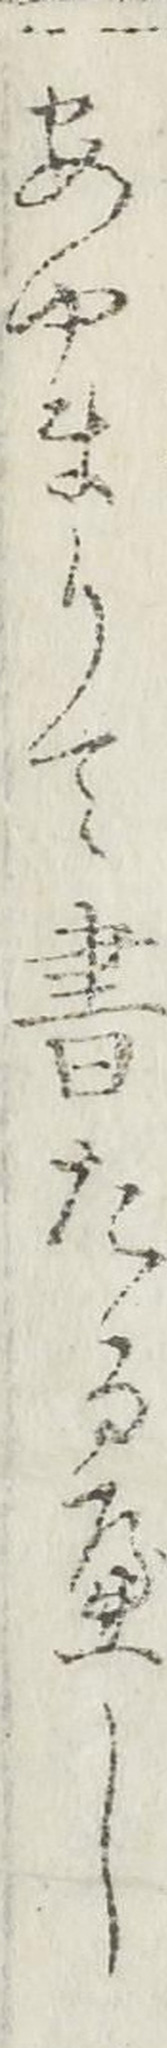あやまりて書たるべし

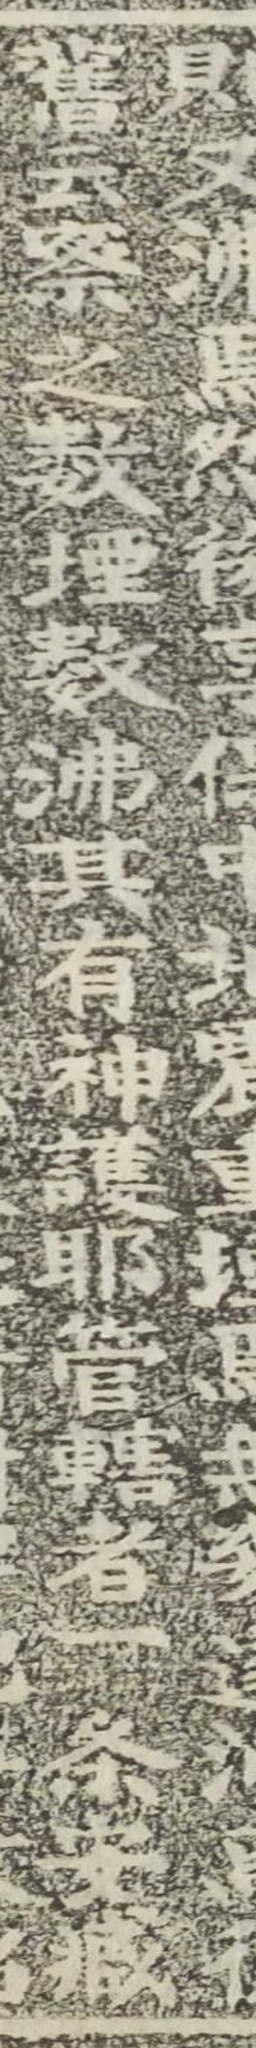舊云察之数堙数沸其有神護耶管轄者一条安臧
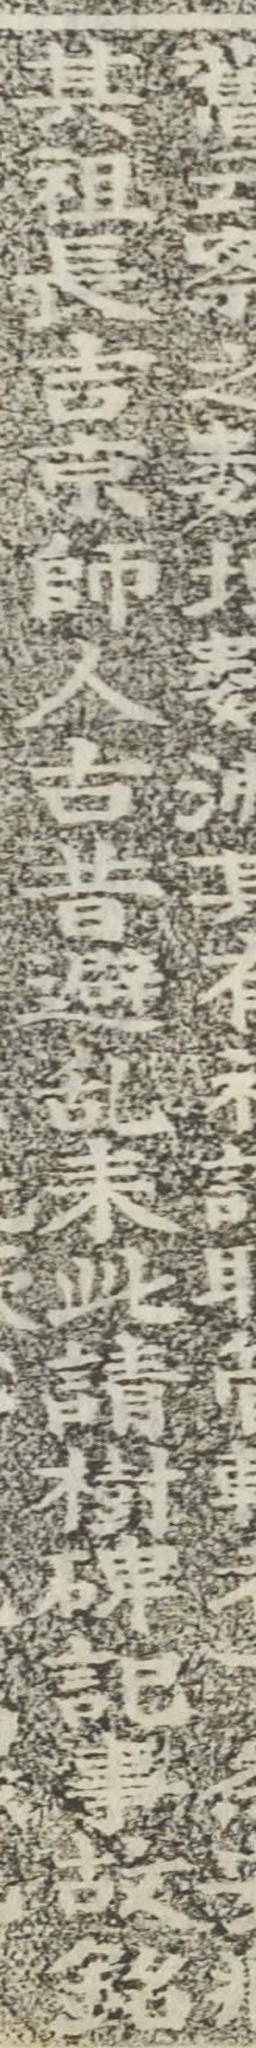其祖長吉京師人古昔避乱未此請樹碑記事故銘
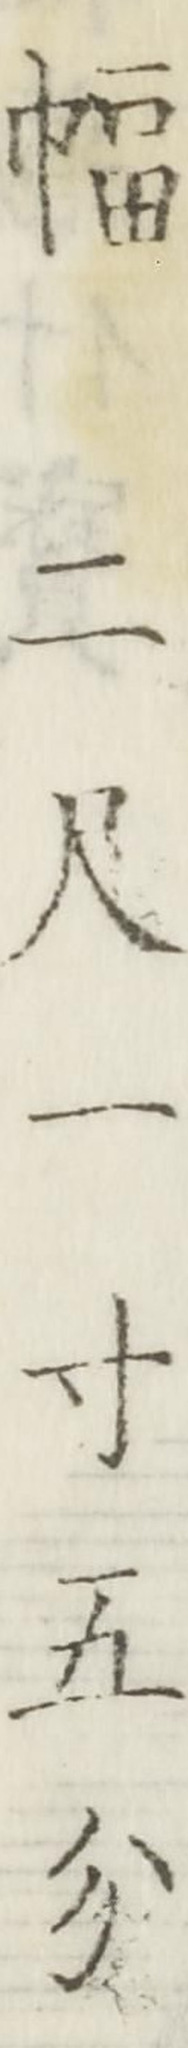幅二尺一寸五分

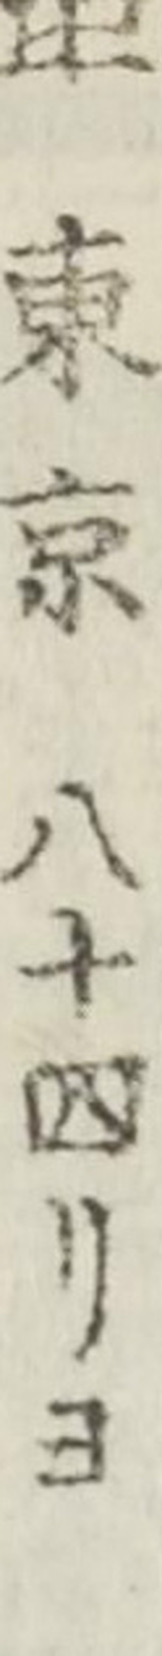距東京八十四リヨ
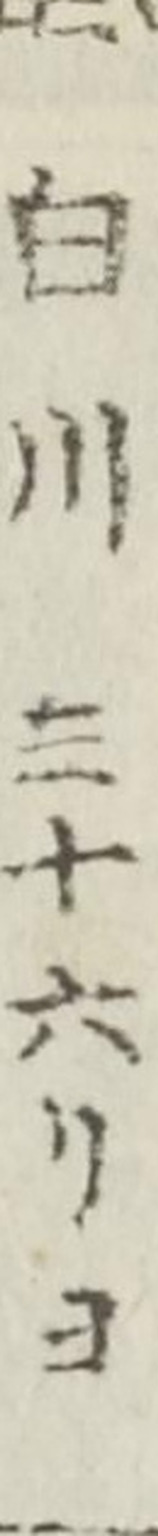距白川三十六リヨ
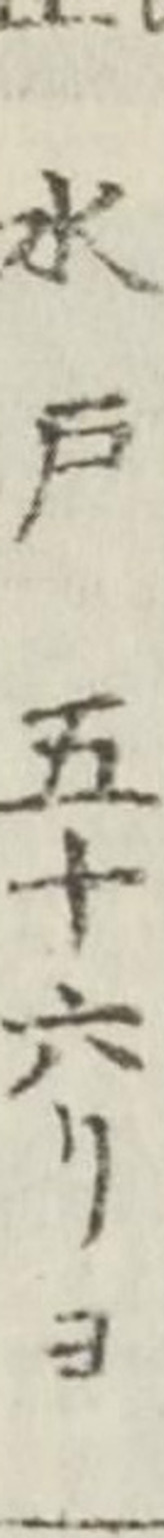距水戸五十六リヨ
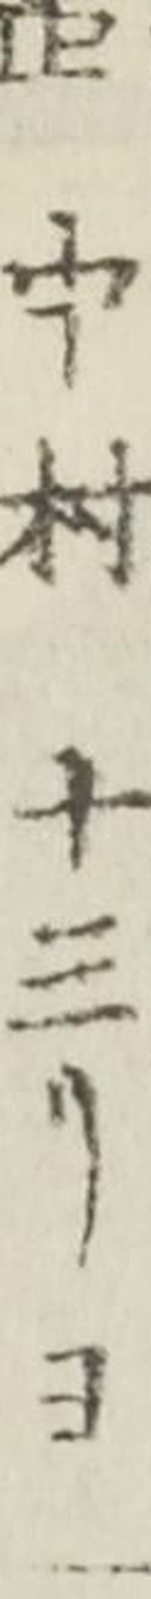距中村十三リヨ
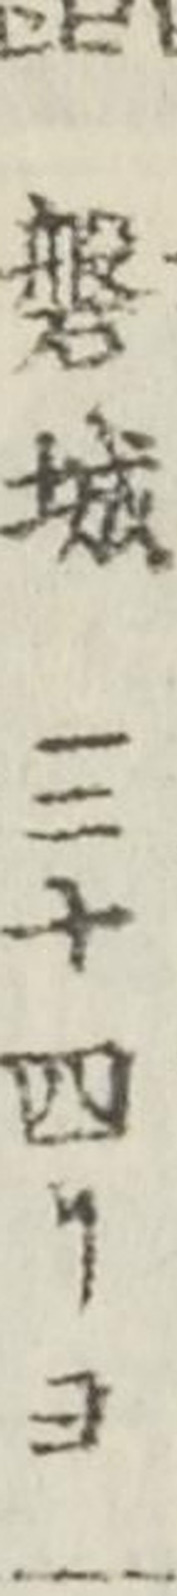距磐城三十四リヨ
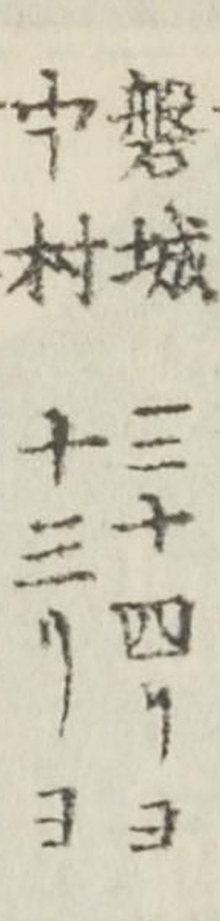距中村十三リヨ
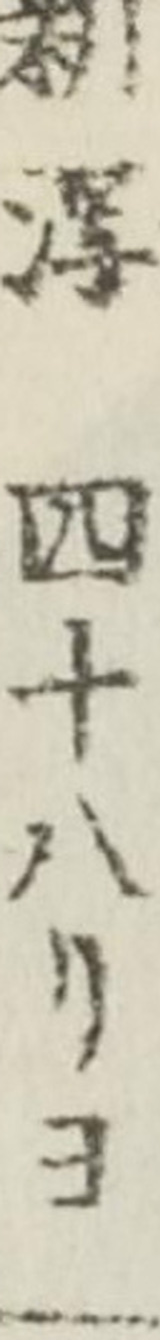距新潟四十八リヨ
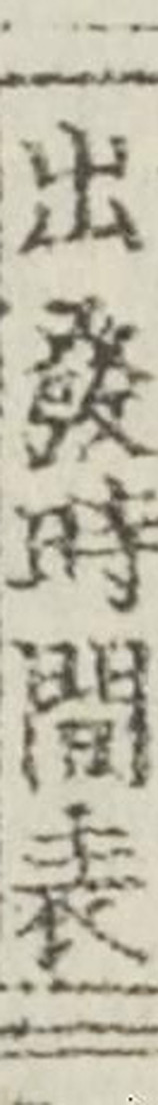出発時間表
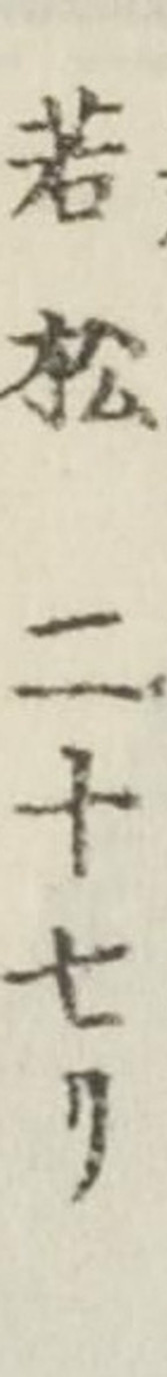距若松二十七リ
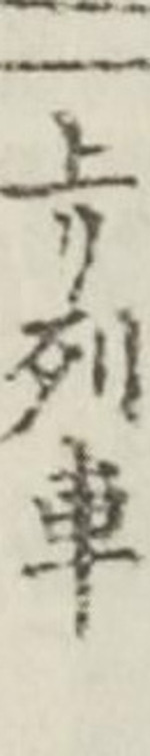上リ列車
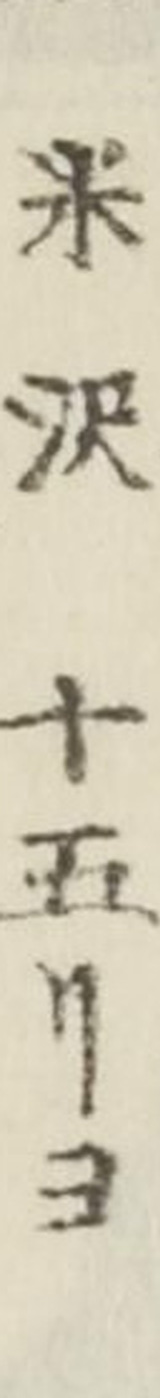距米沢十五リヨ
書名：鎌先温泉由來記
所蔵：東京大学地震研究所図書室 Earthquake Research Institute Library, The University of Tokyo, JAPAN
